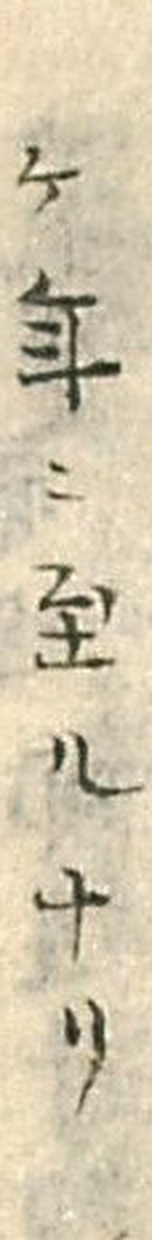ヶ年ニ至ルナリ
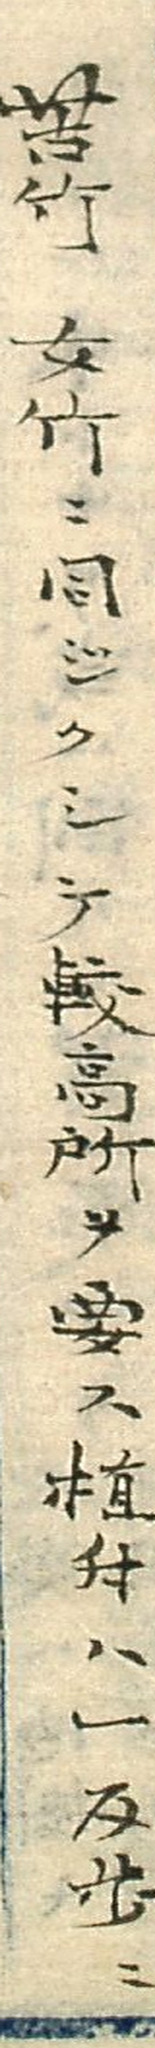苦竹女竹ニ同ジクシテ較高所ヲ要ス植付ハ一反歩ニ
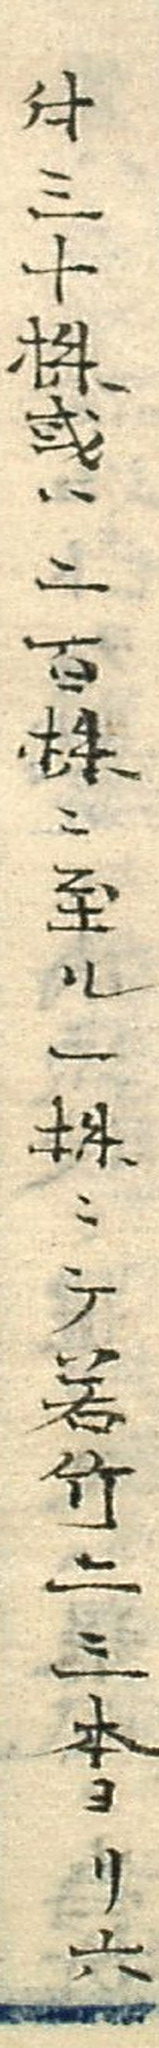付三十株或ハ二百株ニ至ル一株ニテ若竹二三本ヨリ六
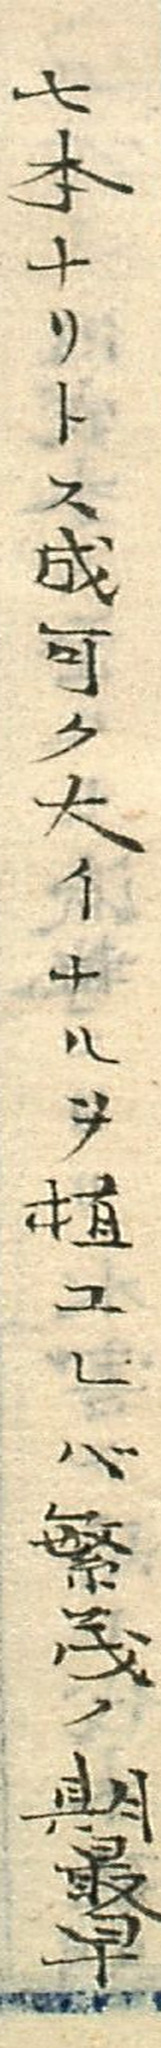七本ナリトス成可ク大イナルヲ植ユレバ繁茂ノ期最早
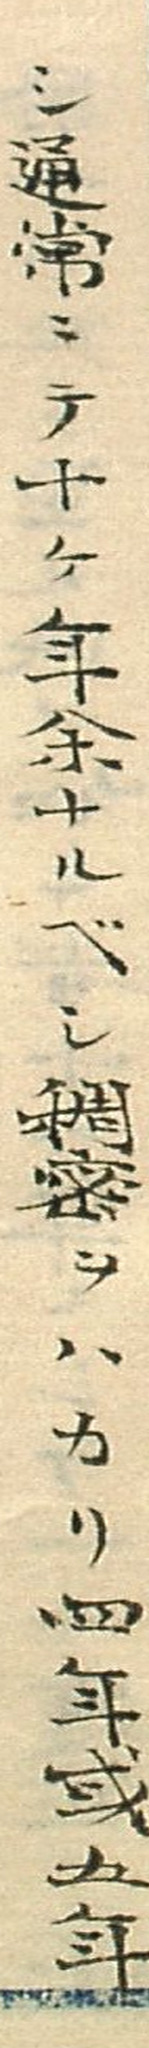シ通常ニテ十ヶ年余ナルベシ稠密ヲハカリ四年或五年
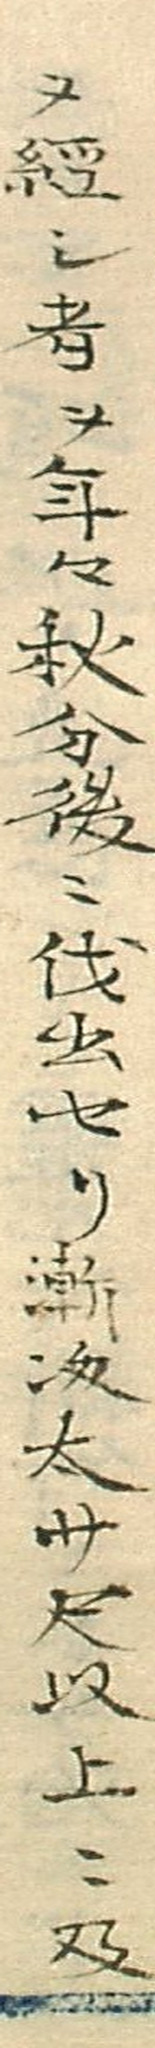ヲ経シ者ヲ年々秋分後ニ伐出セリ漸次太サ尺以上ニ及
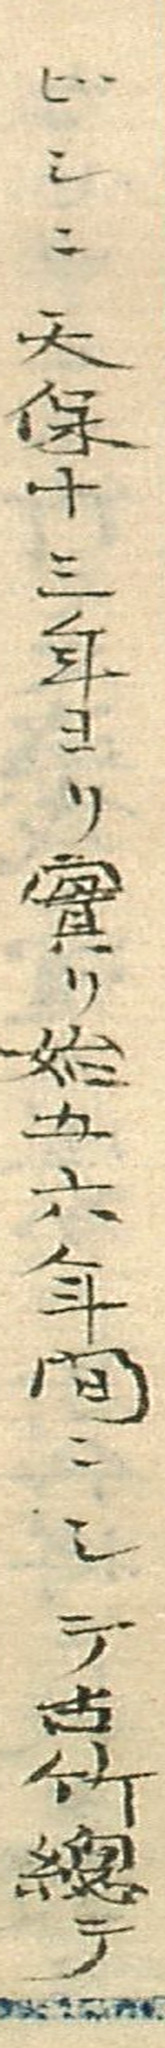ビシニ天保十三年ヨリ実リ始五六年間ニシテ古竹総テ
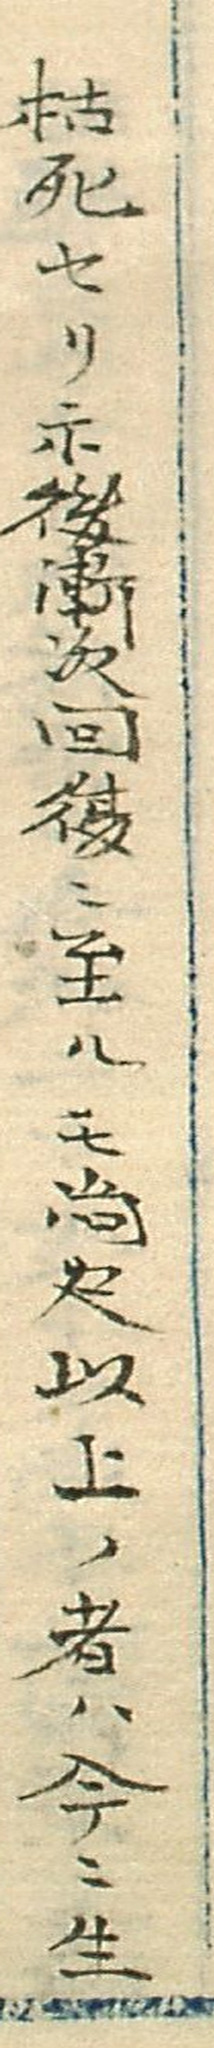枯死セリ示後漸次回復ニ至ルモ尚尺以上ノ者ハ今ニ生
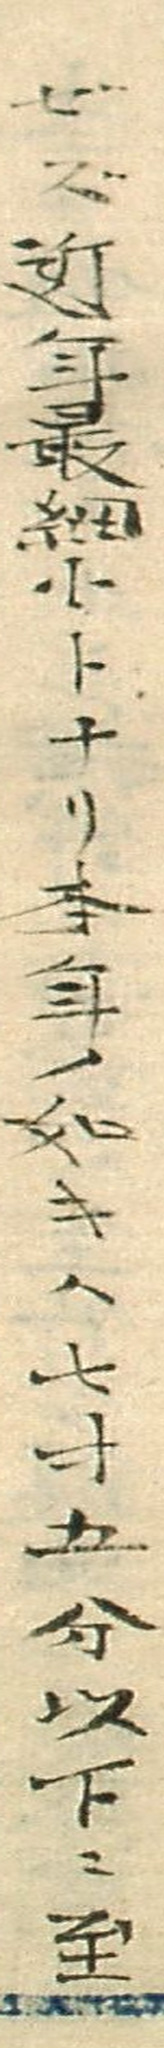ゼズ近年最細小トナリ本年ノ如キハ七寸五分以下ニ至
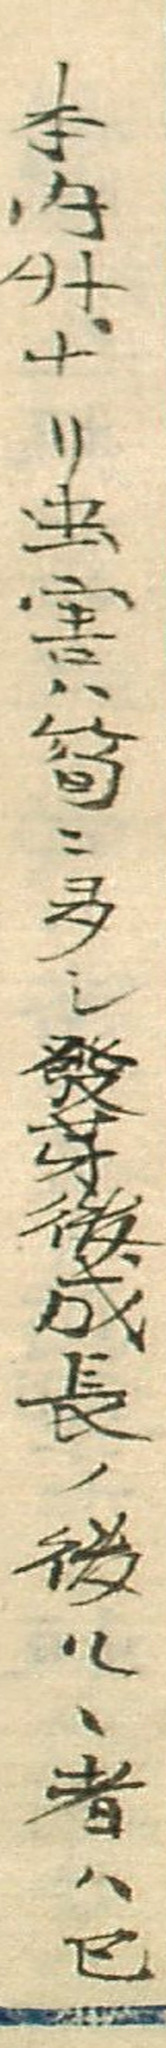本内外ナリ虫害ハ筍ニ多シ発芽後成長ノ後ルヽ者ハ已
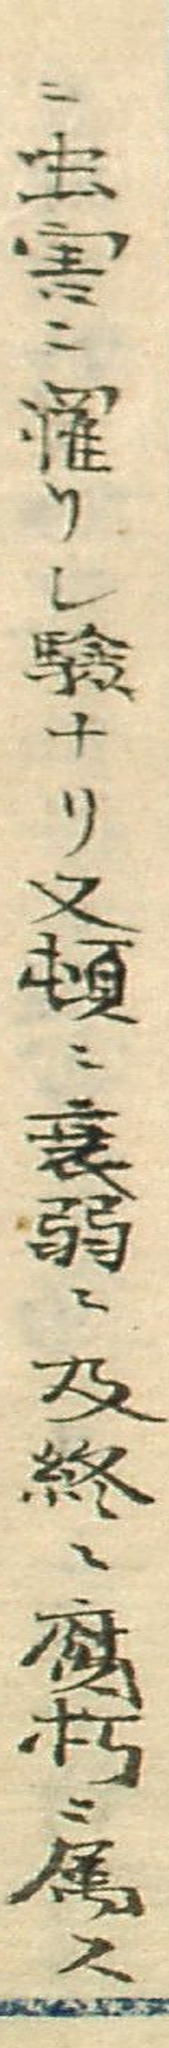ニ虫害ニ罹リシ験ナリ又頓ニ衰弱ニ及終ニ腐朽ニ属ス

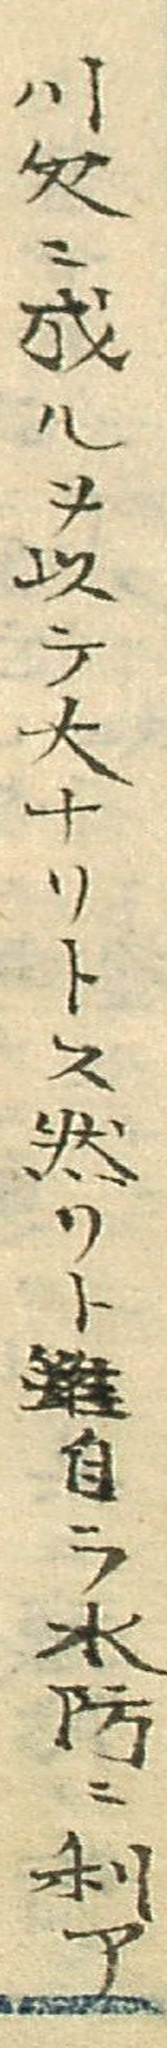川欠ニ成ルヲ以テ大ナリトス然リト雖自ラ水防ニ利ア
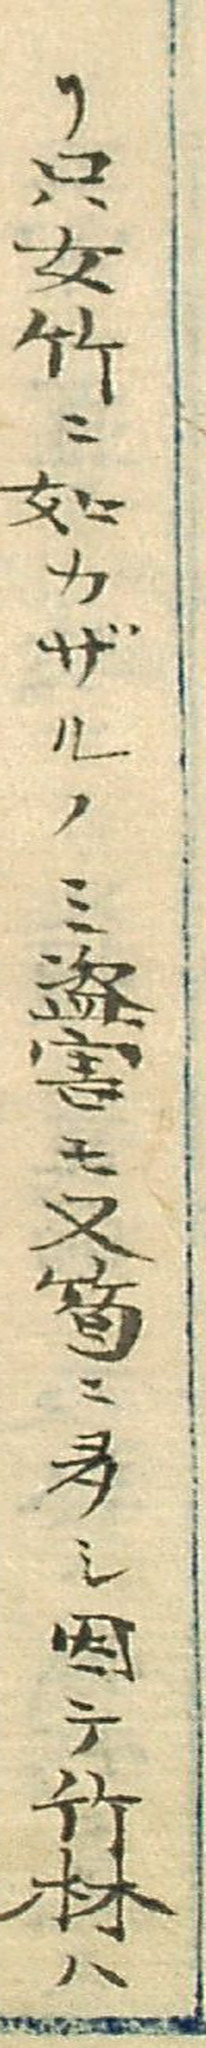リ只女竹ニ如カザルノミ盗害モ又筍ニ多シ因テ竹林ハ
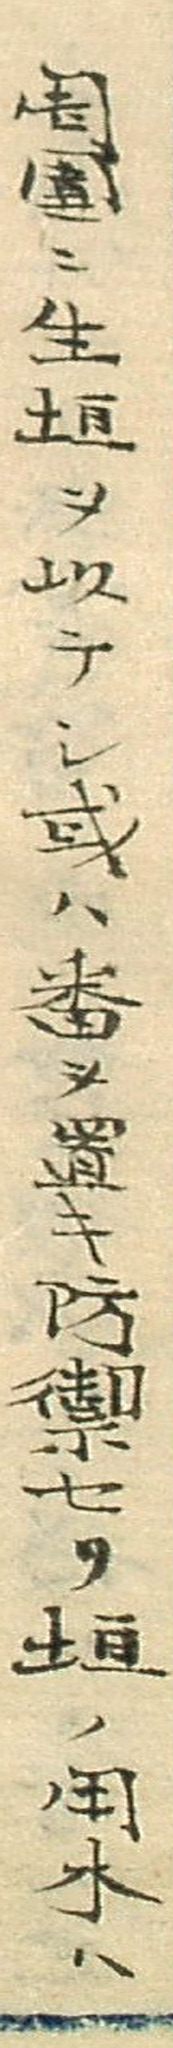周囲ニ生垣ヲ以テシ或ハ番ヲ置キ防禦セリ垣ノ用木ハ
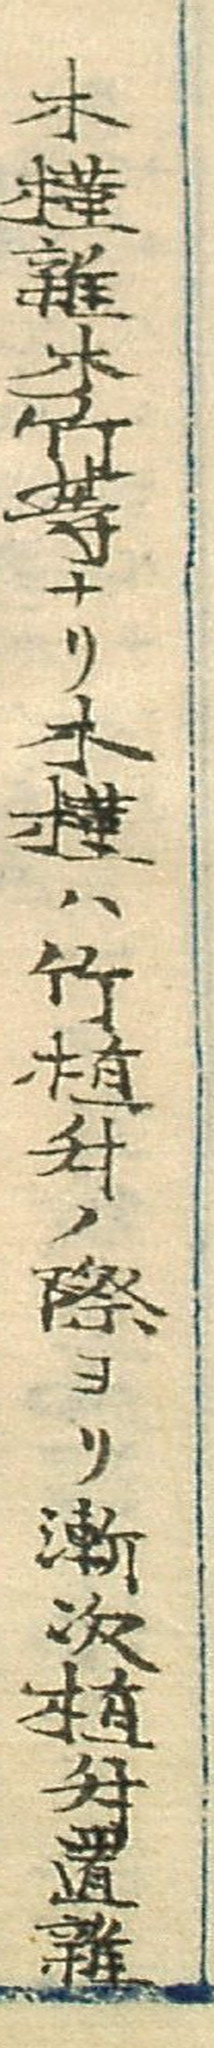木槿雑木竹等ナリ木槿ハ竹植付ノ際ヨリ漸次植付置雑
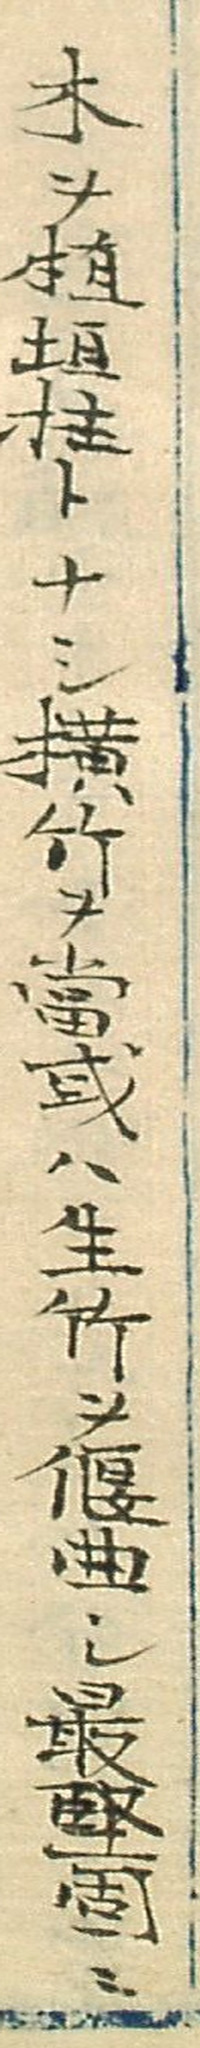木ヲ植垣柱トナシ横竹ヲ当或ハ生竹ヲ偃曲シ最堅固ニ
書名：山林共進会取調書
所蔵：鳴門教育大学 Naruto University of Education
